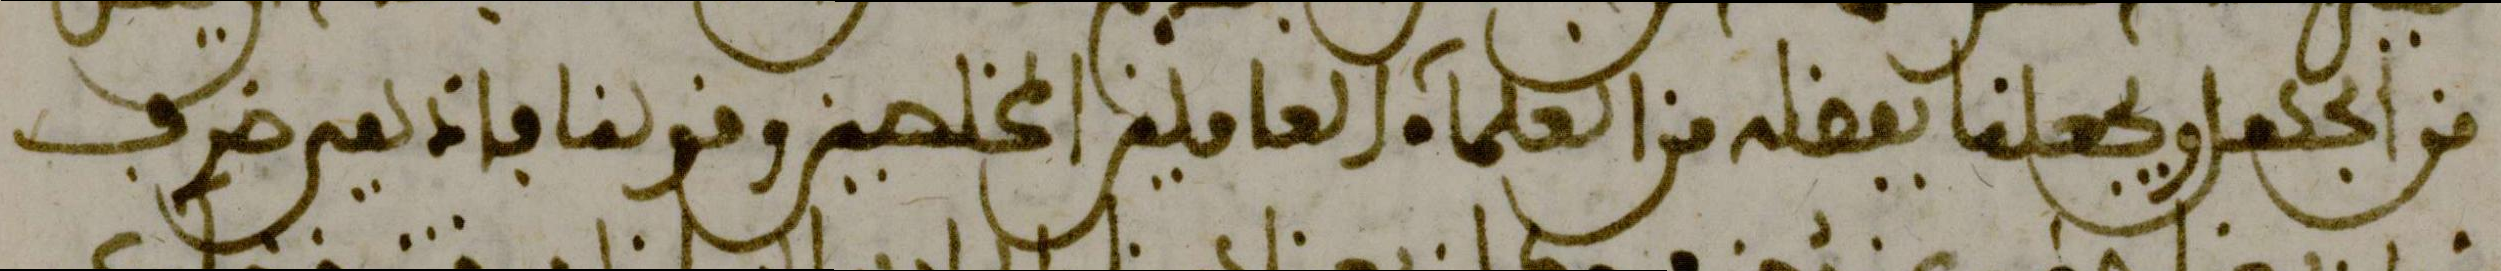من الجهل ويجعلنا يفضله من العلماء العاملين المخلصين وقولنا فاذهي ضرف
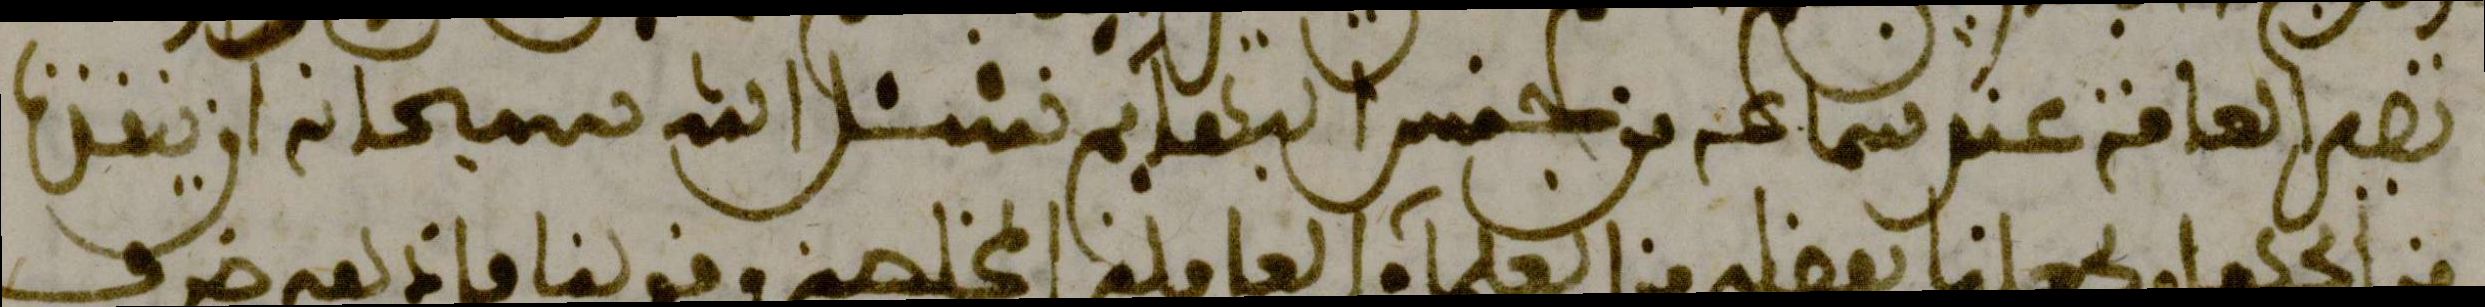تصير العامة عند سماعه من جنس البهائم نسئل الله سبحانه ان ينقذن
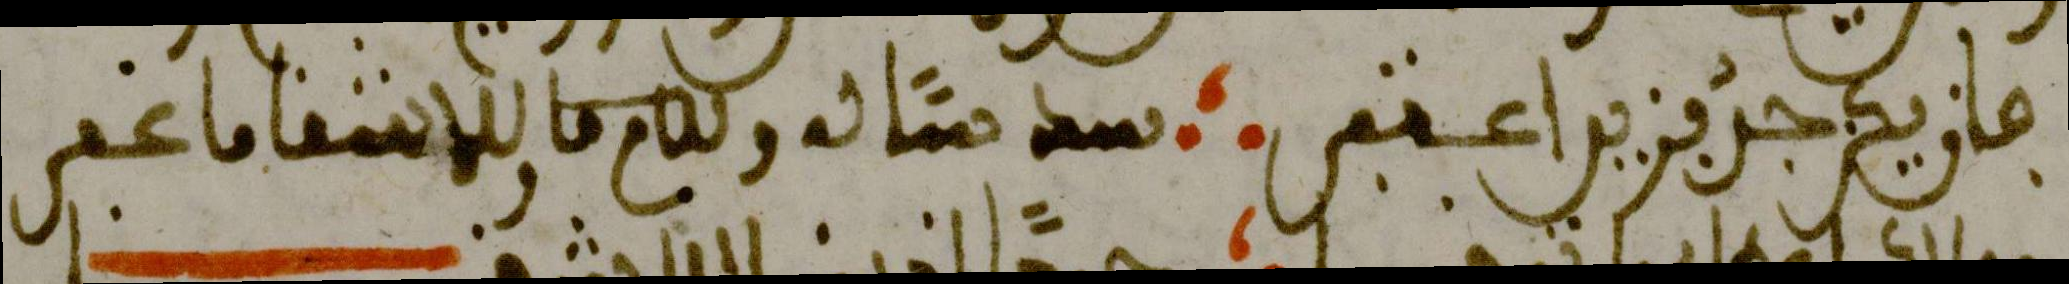فان يكن جد فزيد اعتبر سدسًا له وللام ما للاشقا ما غبر
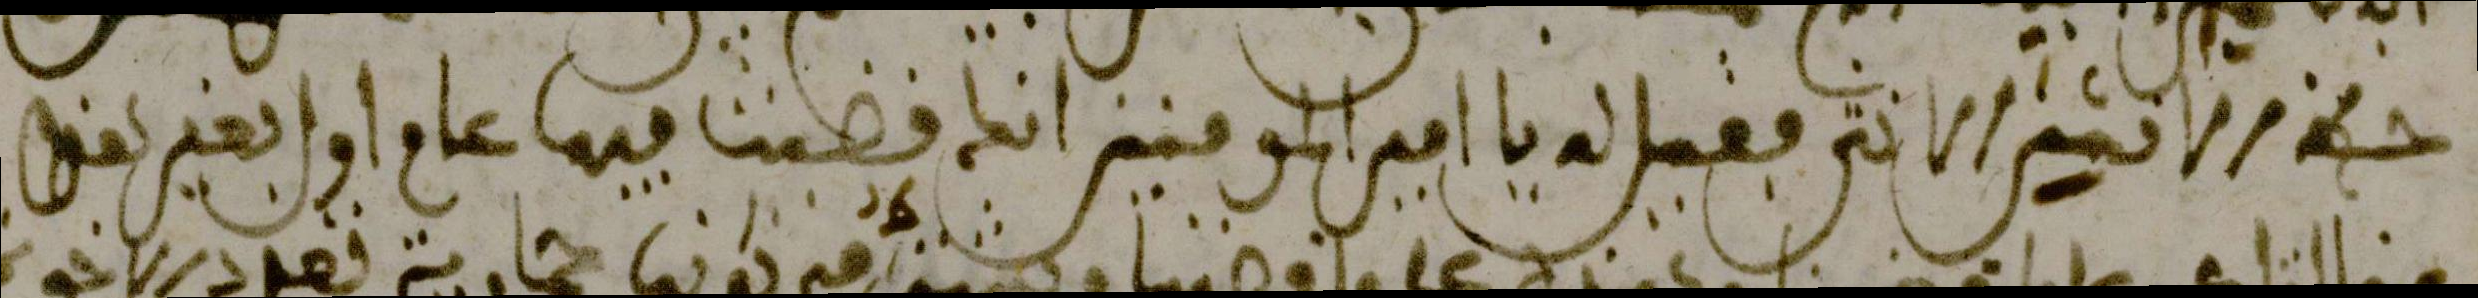حظ الانثى الانثى فقيل له يا امير المومنين انك قضيت فيها عام اول بغير هذا
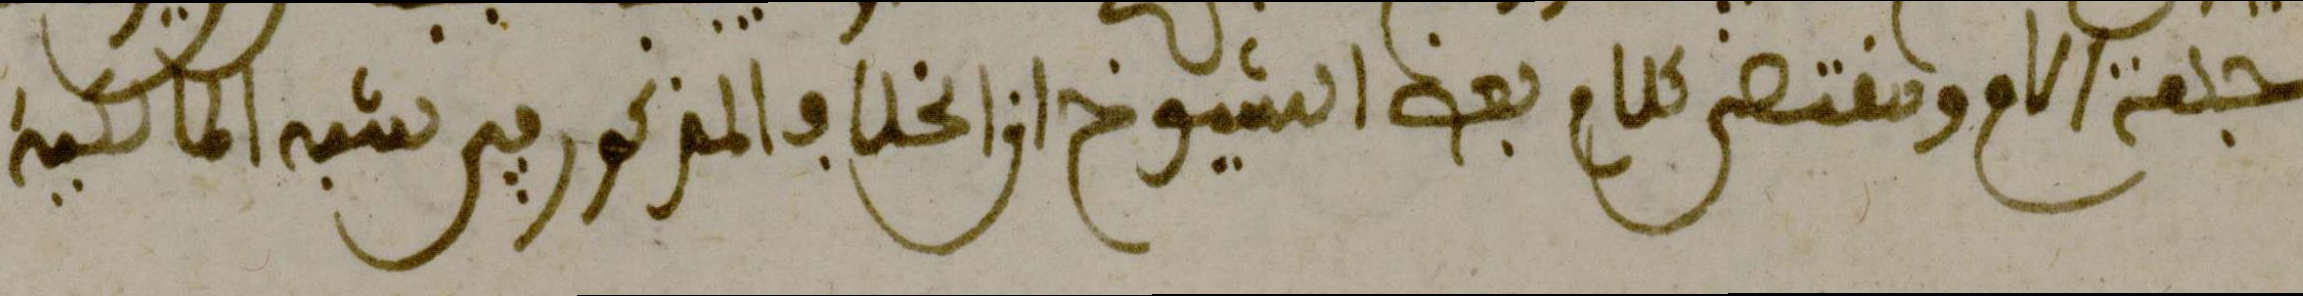جهة الام ومقتضى كلام بعض الشيوخ ان الخلاف المذكور في شبه المالكية
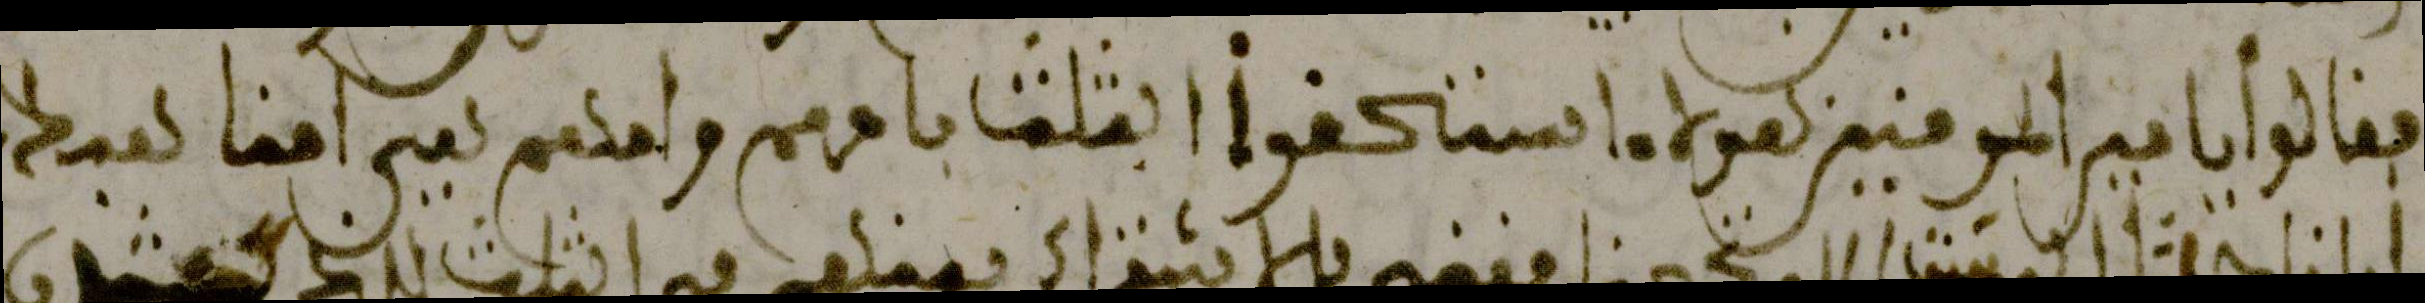فقالوا يامير المومنين هولاء استحقوا الثلث بامهم وامهم هي امنا هبك
